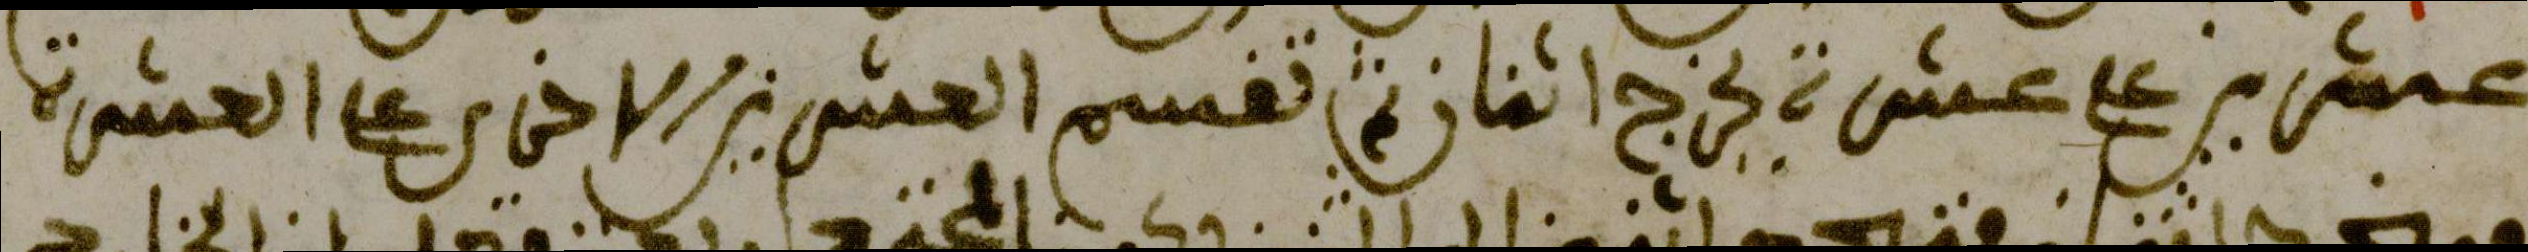عشرين على عشرة يخرج اثنان ثم تقسم العشرين الاخرى على العشرة
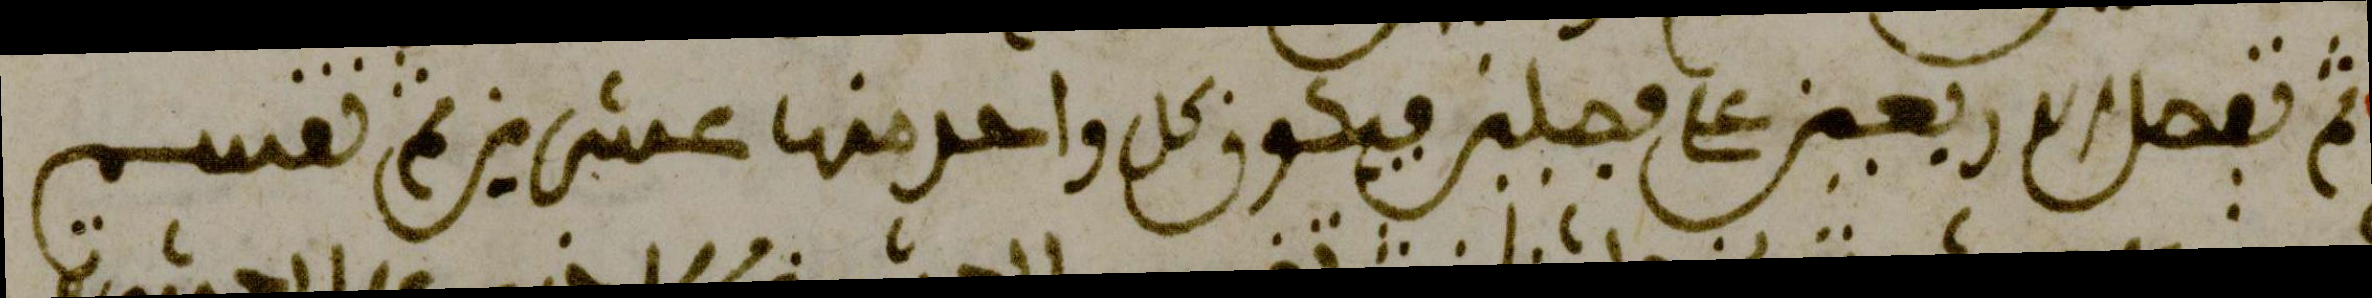ثم تفصل الاربعين على فصلين فيكون كل واحد منها عشرين ثم تقسم
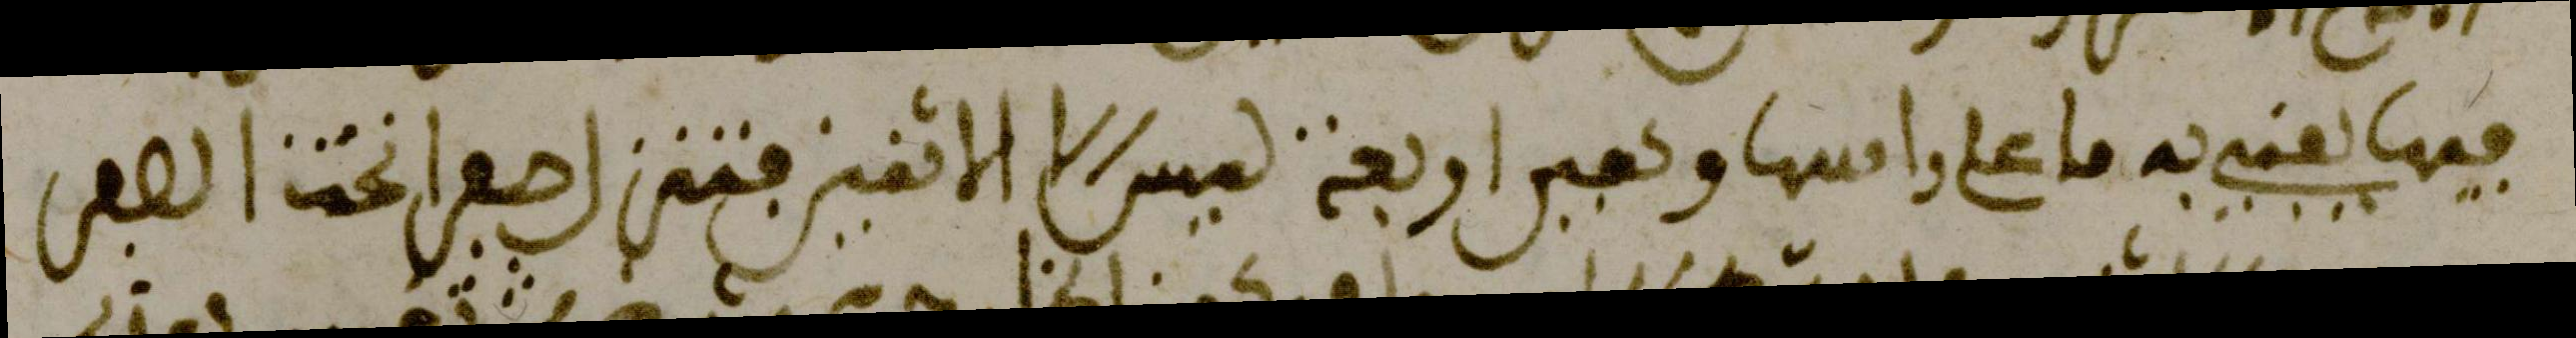فيها يفني به ما على راسها وهي اربعة ليس الا الاثنين فتنزل صفرا تحت الصفر
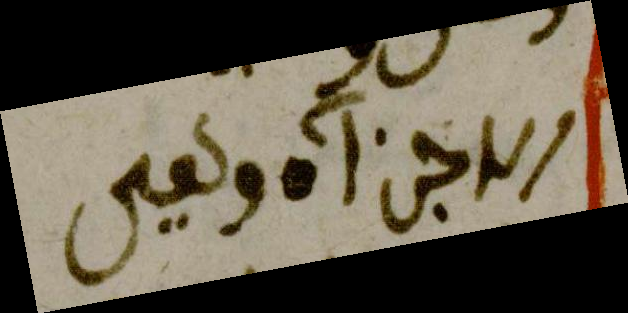الاجزاء وهي
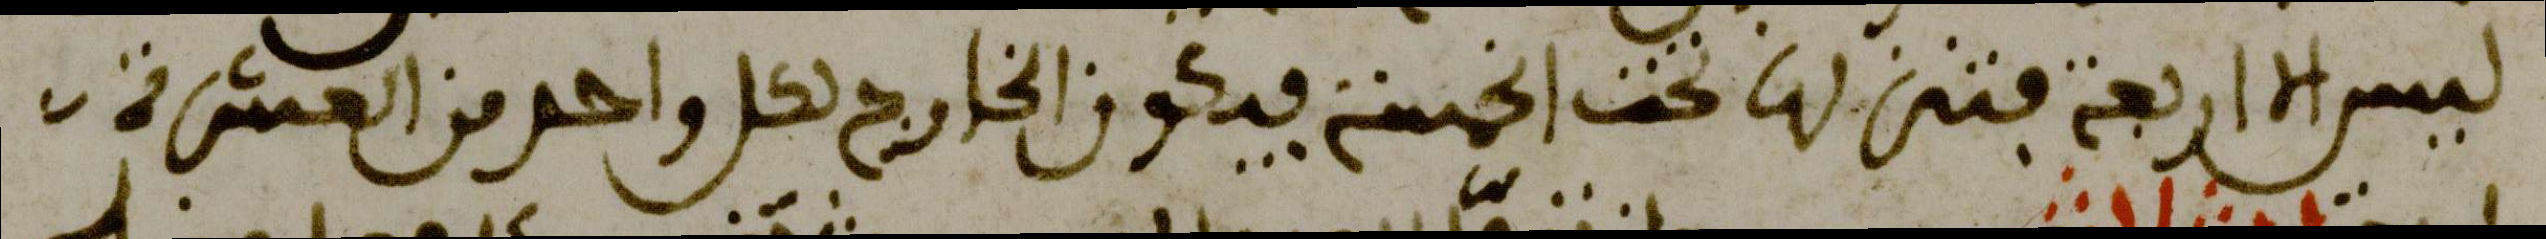ليس الا اربعة فتنزلها تحت الخمسة فيكون الخارج لكل واحد من العشرة
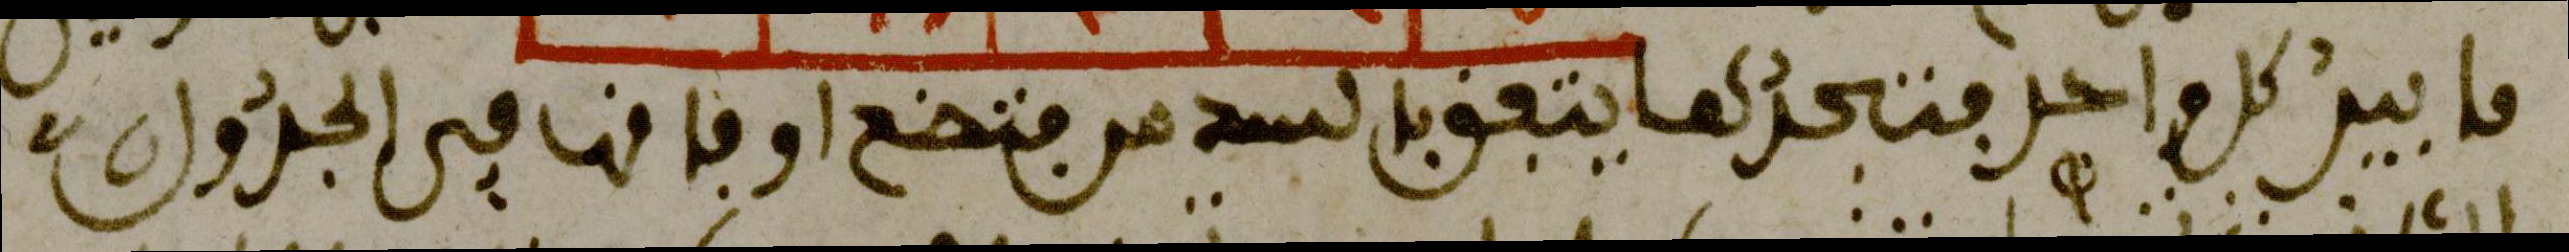ما بيد كل واحد فتجدها يتفق بالسدس فتضع او فاقها في الجدول
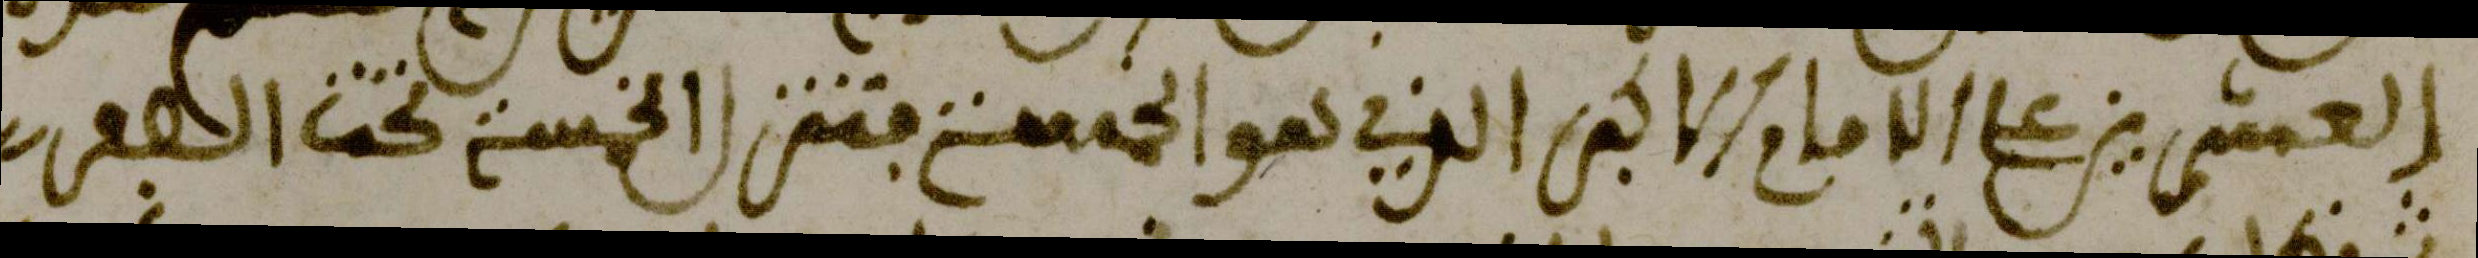العشرين على الامام الاكبر الذي هو الخمسة فتنزل الخمسة تحت الصفر
